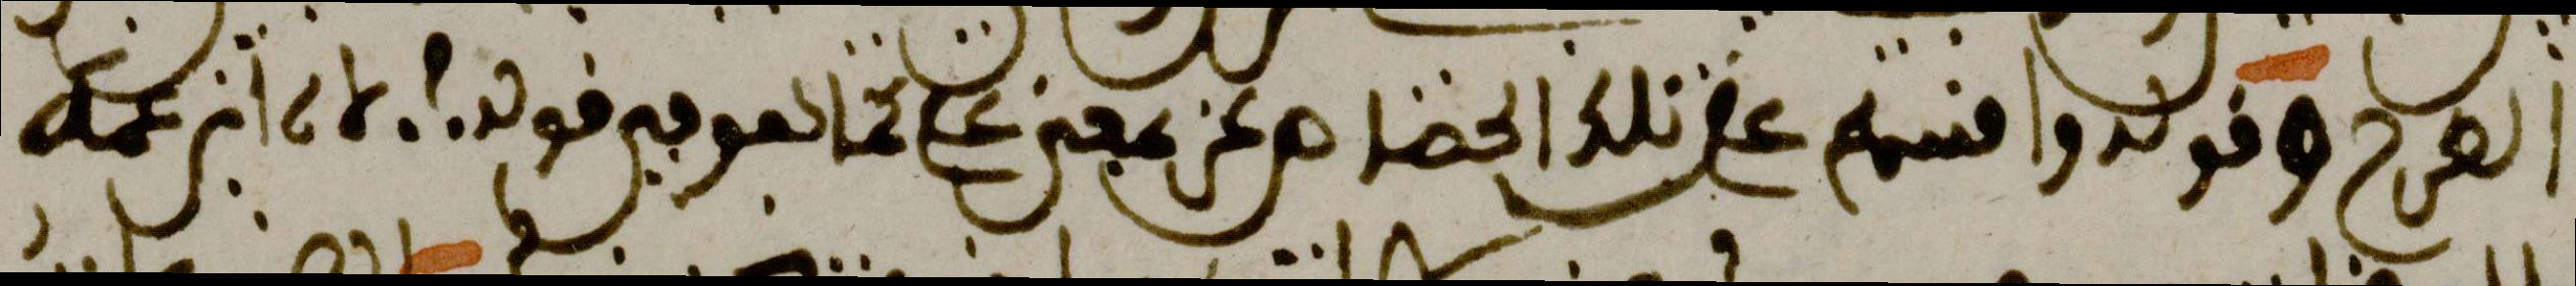الطرح وَقوله واقسمه على تكل الحصاص عن بمعنى على كما هو في قوله لاه ابن عمك
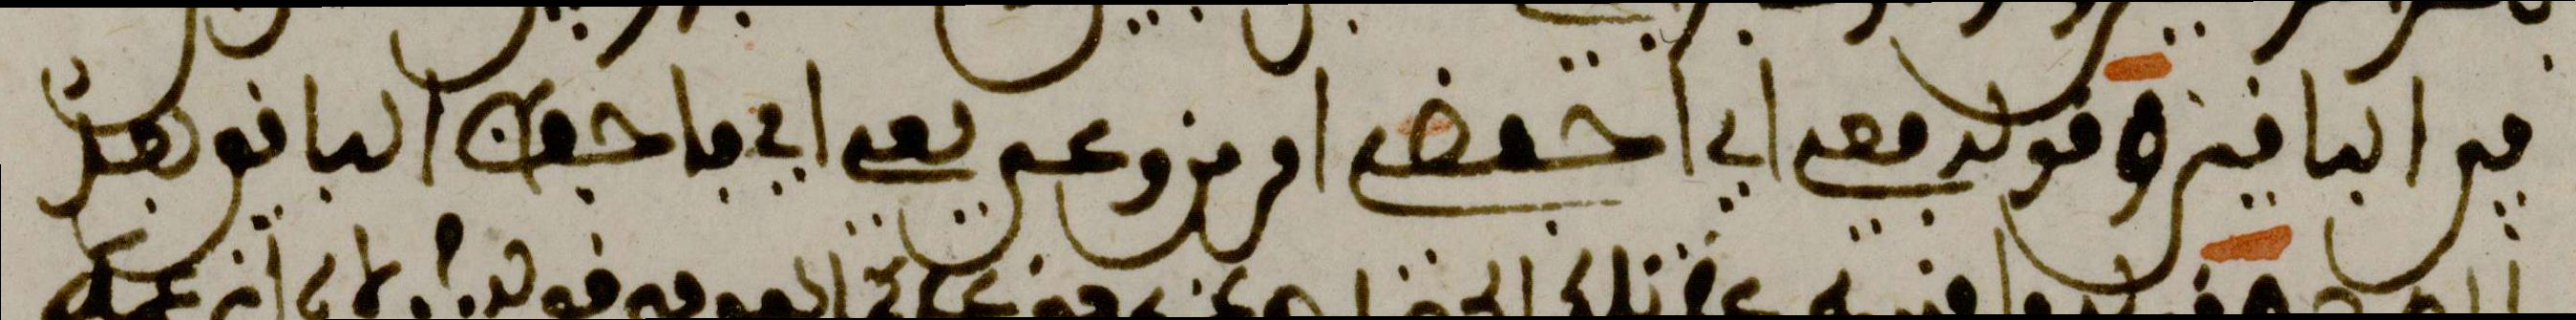في الباقين وَقوله فعي اي احفضه امر من وعي يعي اي فاحفظ الباقي بعد
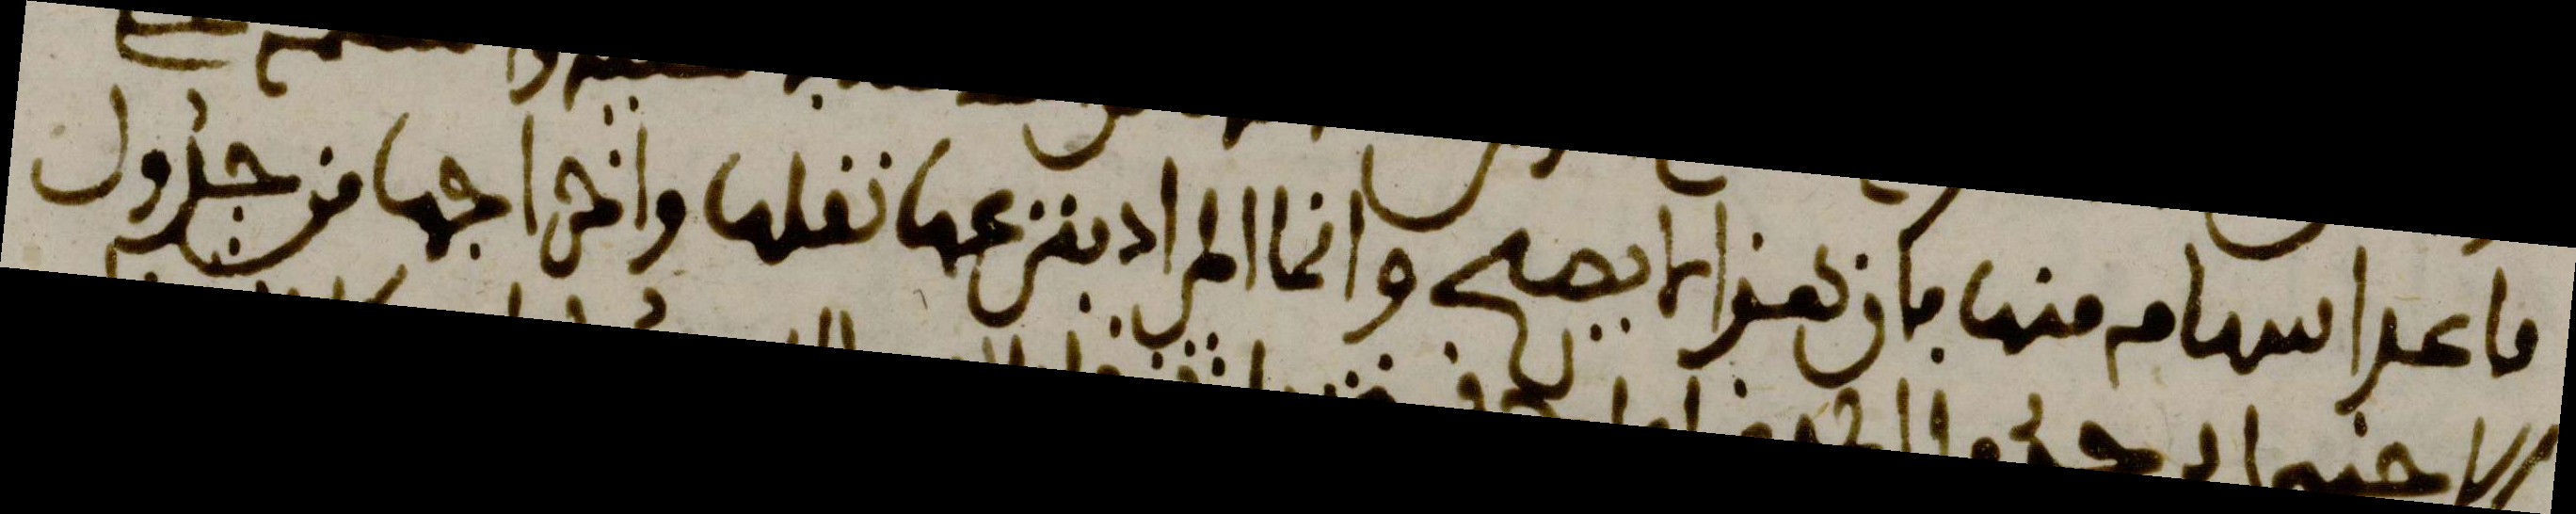ماعدا سهامه منها فان هذا لا يصح وانما المراد بنزعها نقلها واخراجها من جدول
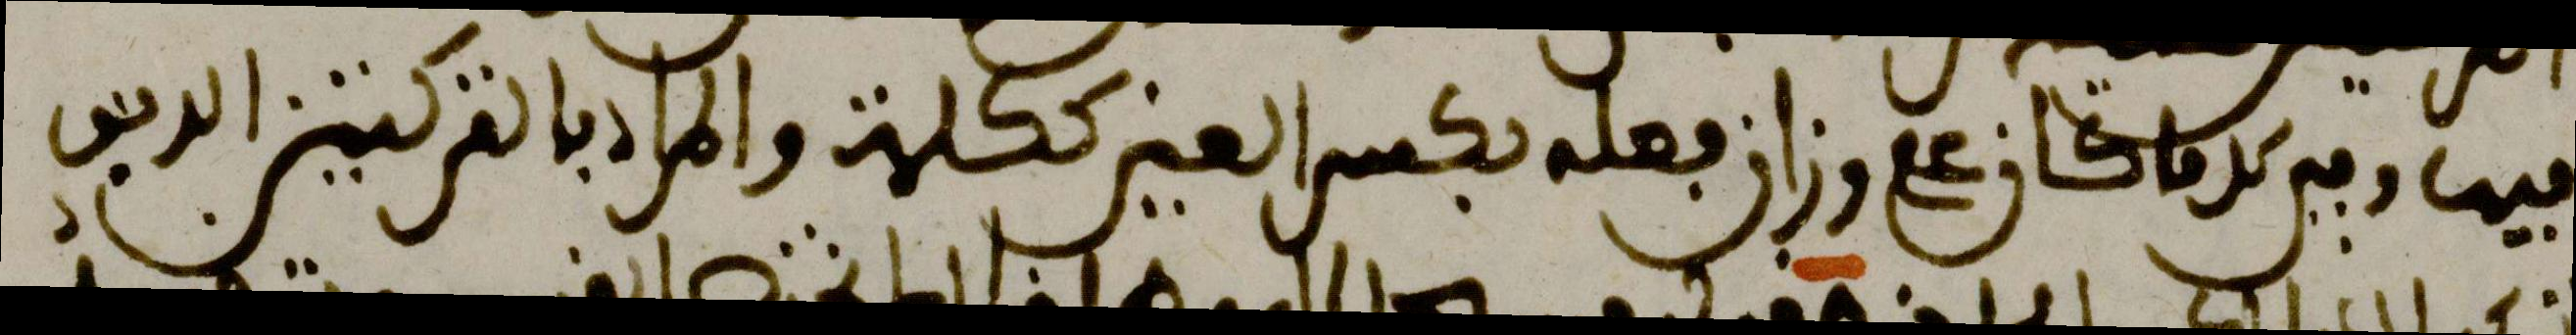فيها وفي كل ما كان على وزان فعله بكسر العين ككلمة والمراد بالتركتين الدين
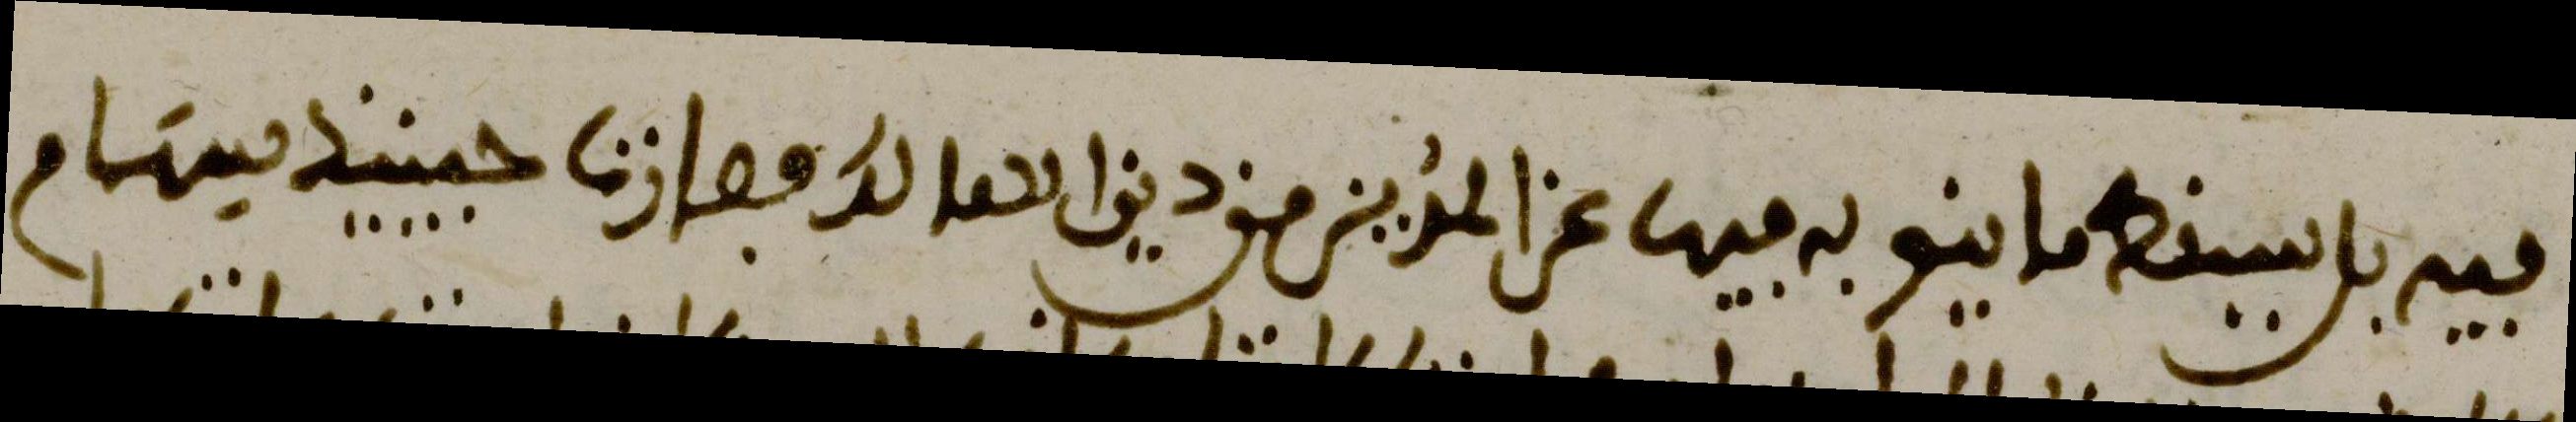فيه بل يسقط ما ينو به فيها عن المين من دين الهالك فصارت حينيذ سِهَام
